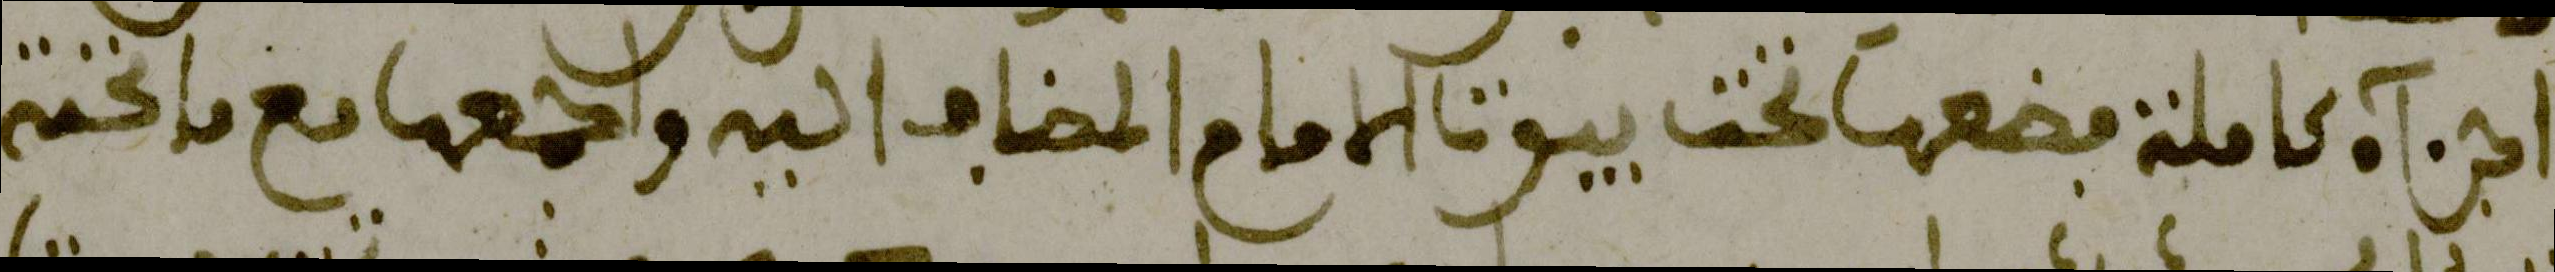اجزاء كاملة فضعها تحت بيوت الامام المضاف اليه اجمعها مع ما تحته
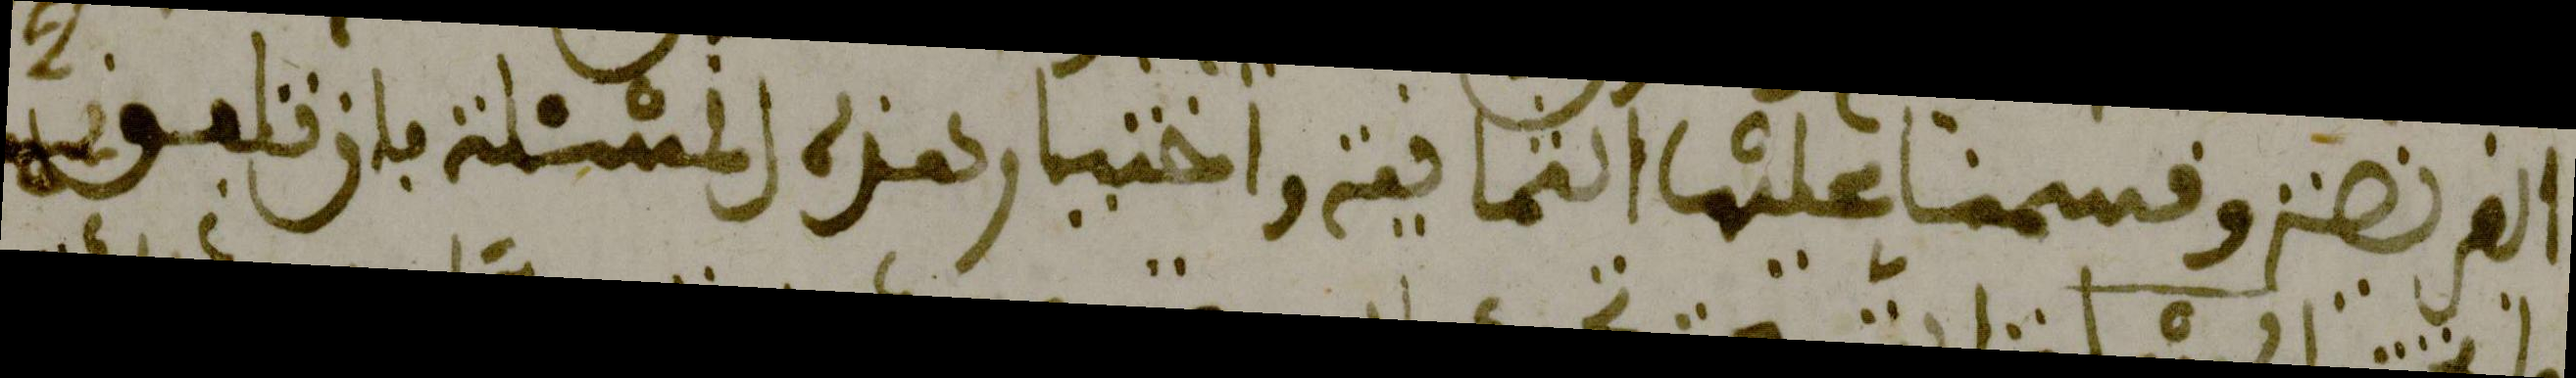الفريضة وقسمنا عليْها الثمانية واختبار هذه المسْئلة بان تلفق
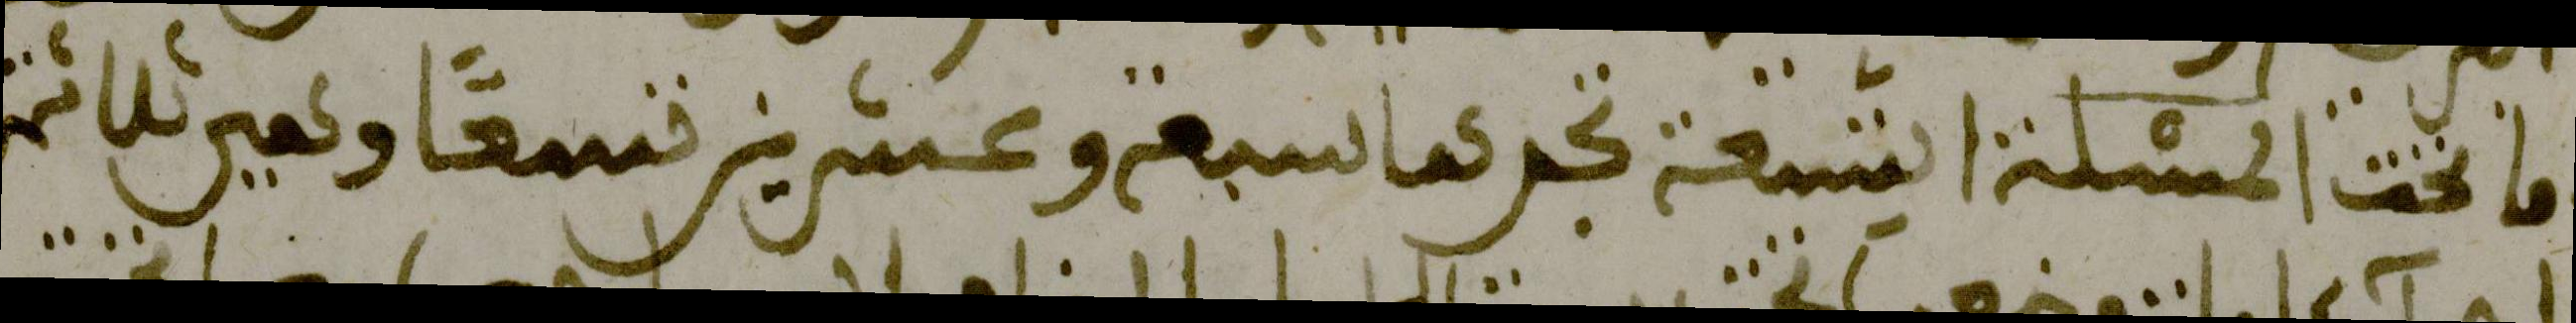ما تحت المسْلة التِّسعة تجدها بسبعة وعشرين تسعًا وهي ثلاثة
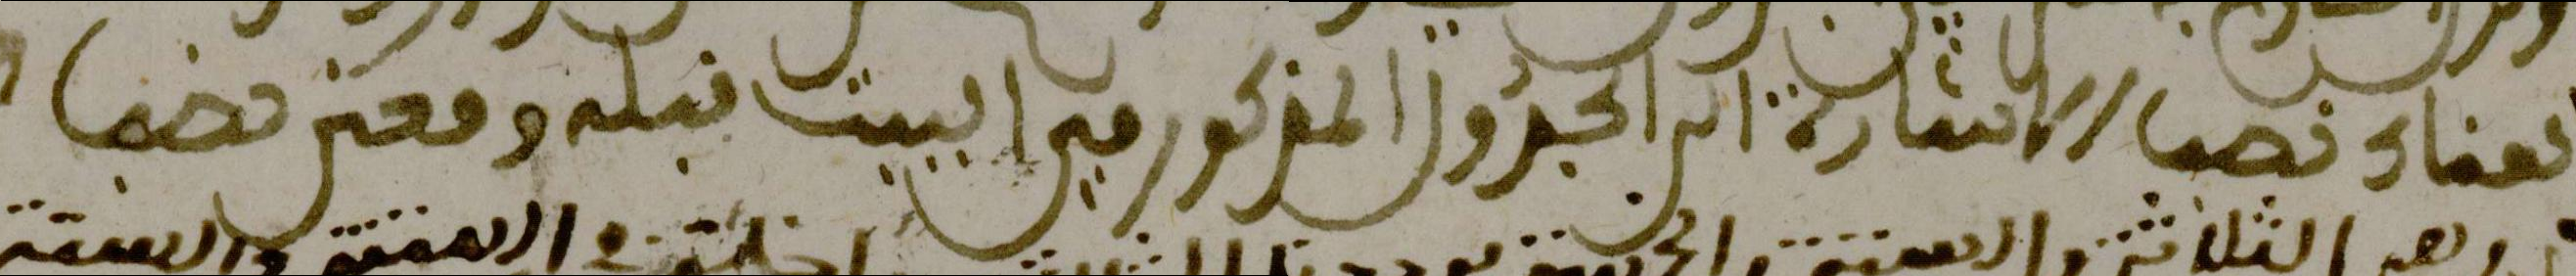هناك نصبا الاشارة الى الجدول المذكور في البيت قبله ومعنى نصب
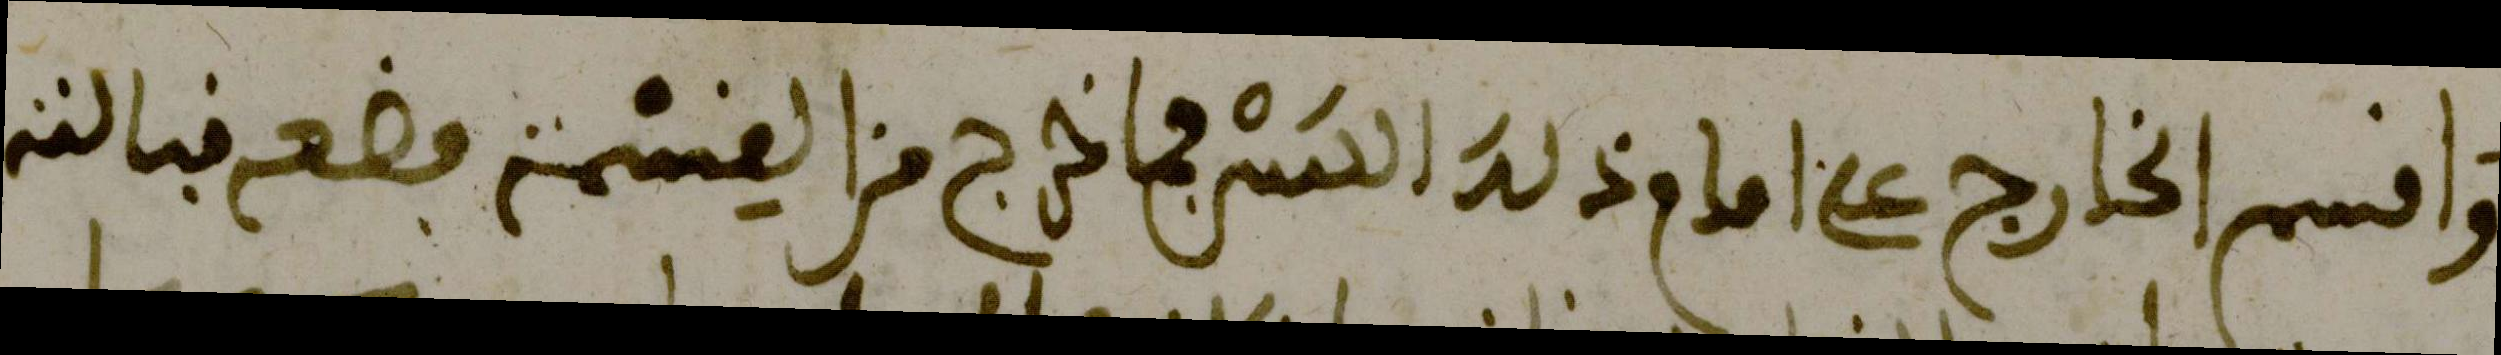واقسم الخارج على امام ذلك الكسْر فما خرج من القِسْمة فضعه قبالته
